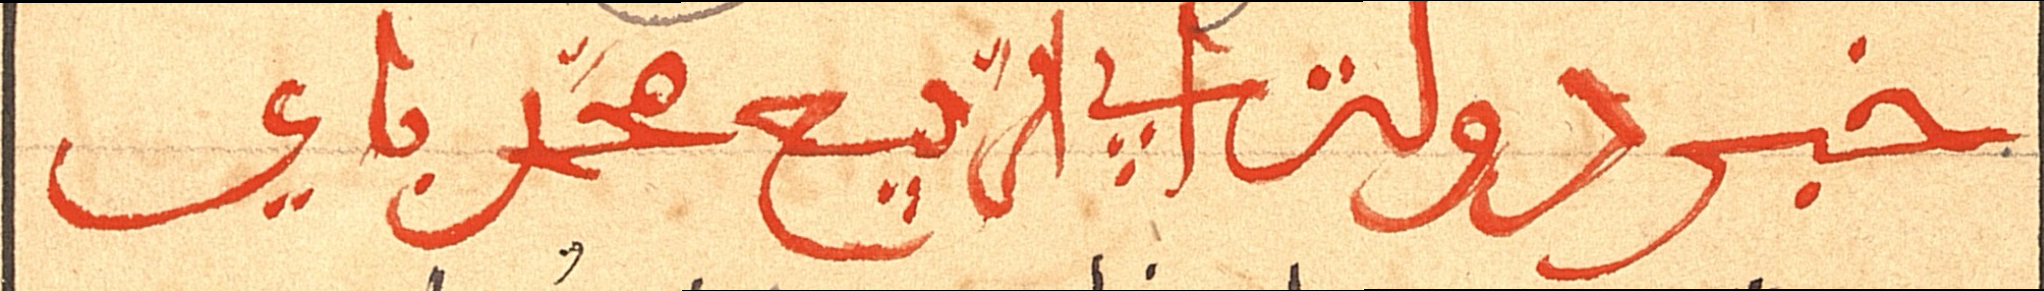خبر دولت اي الى بيع محمد باي
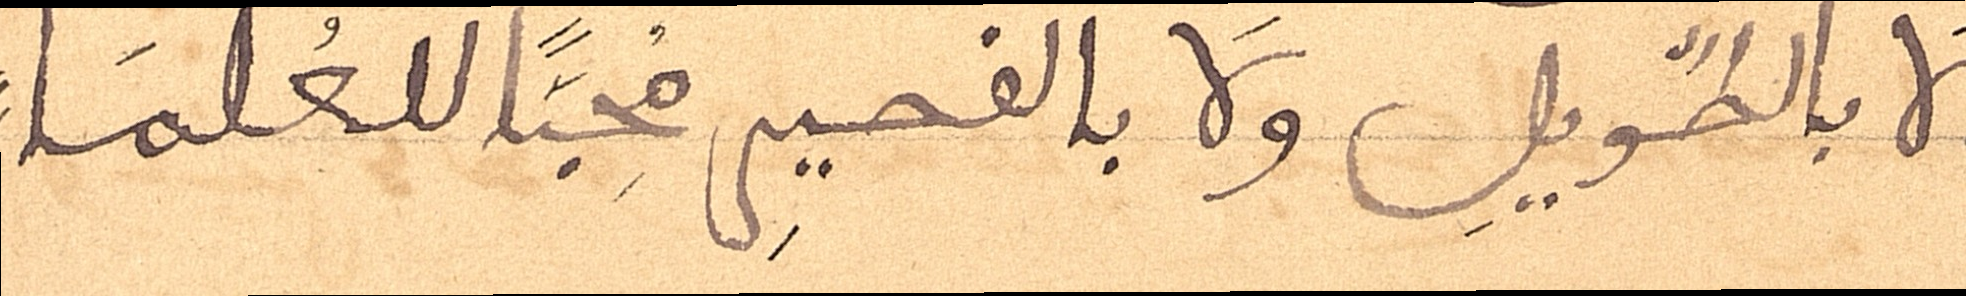لا بالطويل ولا بالقصير محبا للعلما
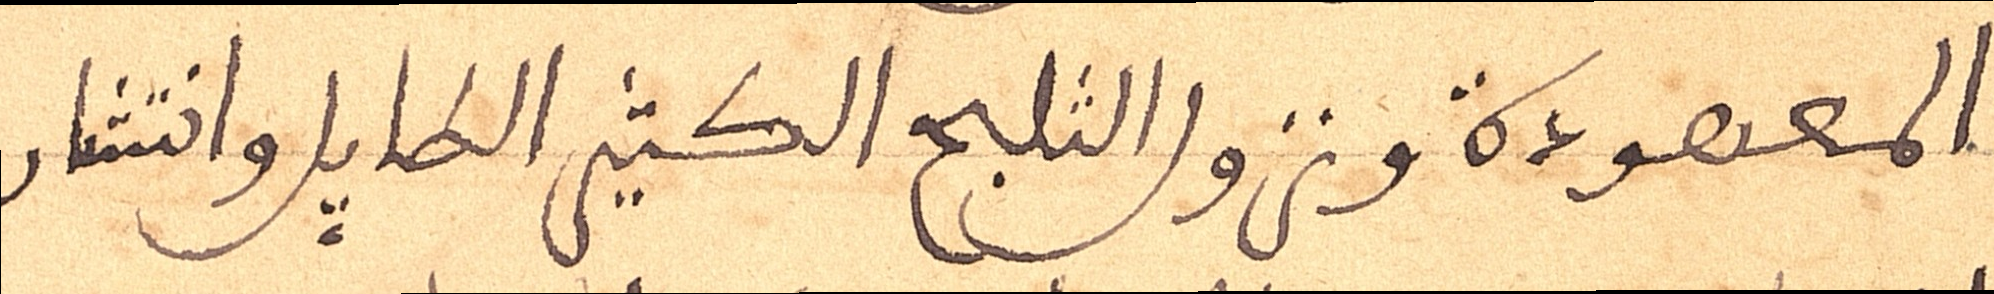المعهودة ونزول الثلج الكثير الطائل وانتشار
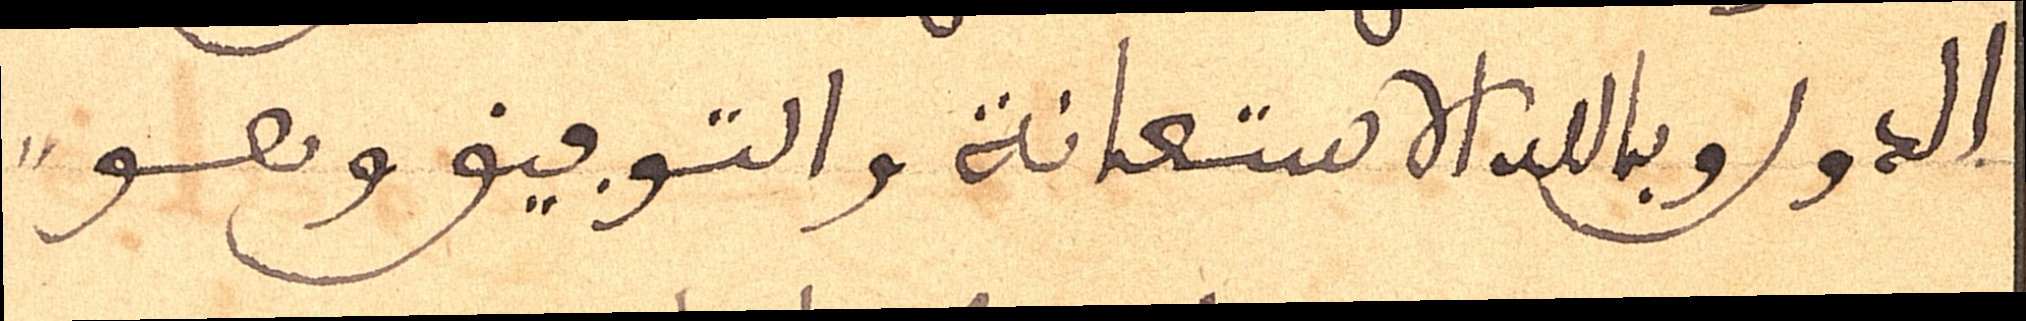الدول وباللد الاستعانة والتوفيق وهو
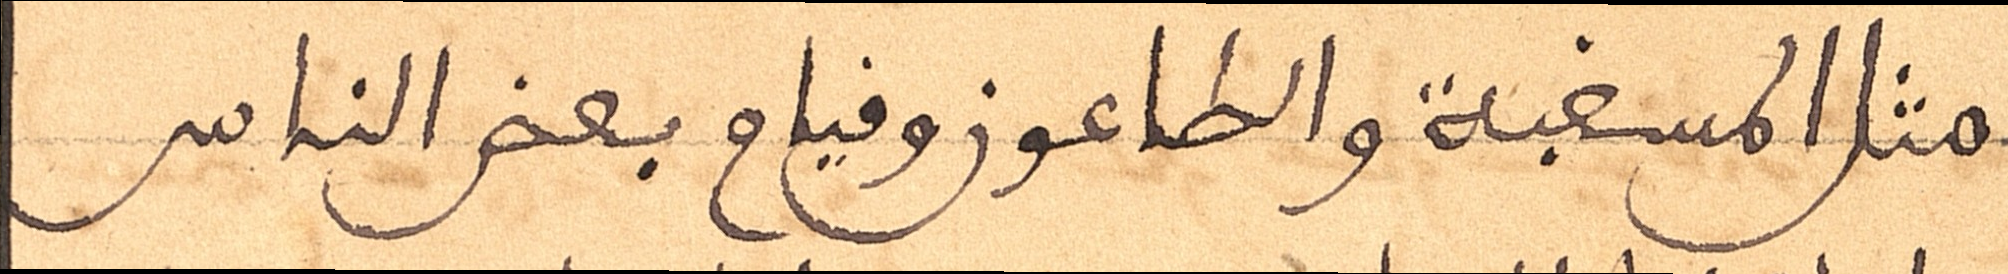مثل المسغبة والطاعون وقيام بعض النلس
